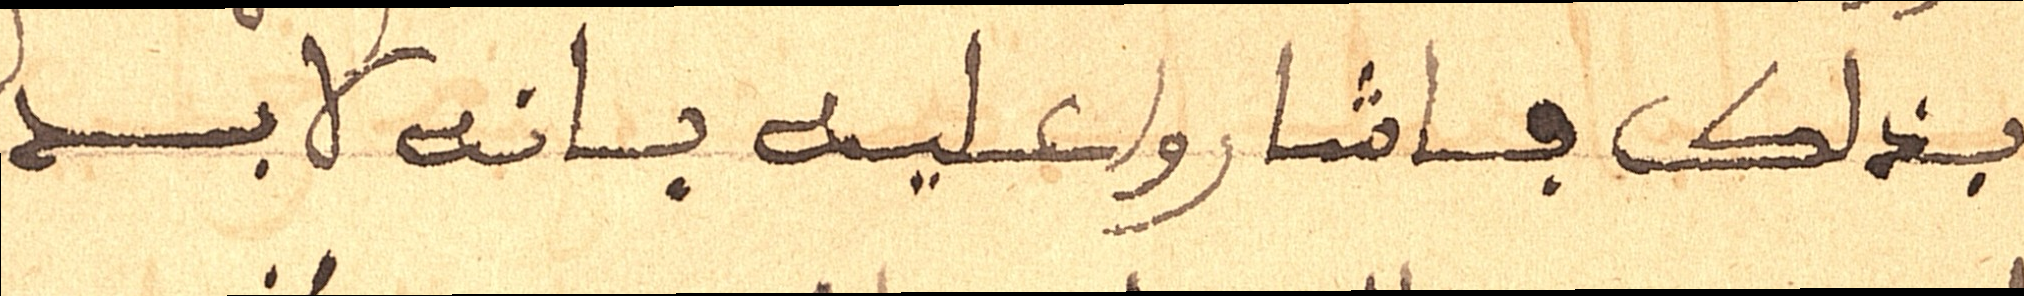بذلك فاشاروا عليه بانه لا بد
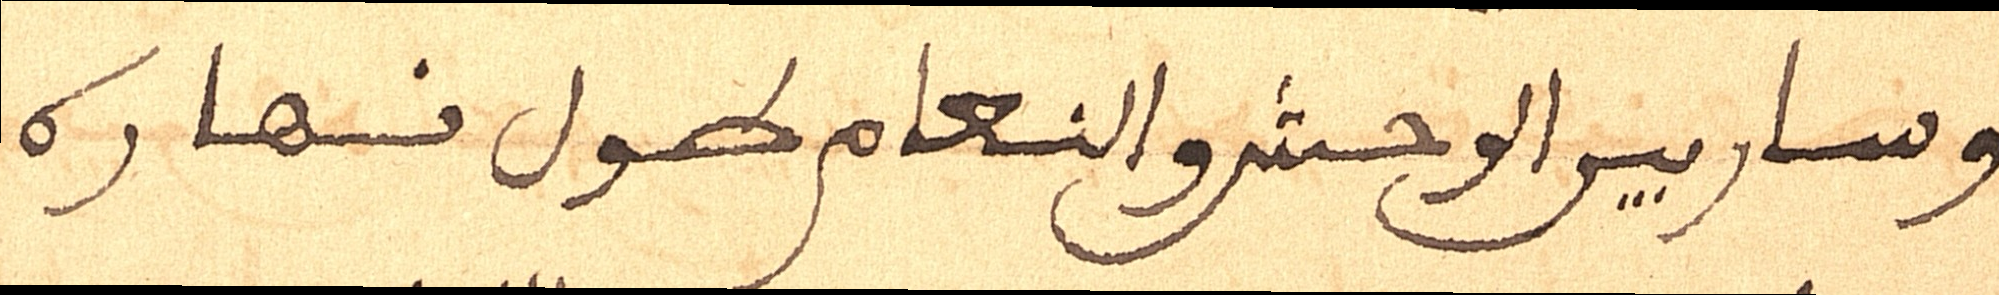وسار بين الوحش والنعام طول نهاره
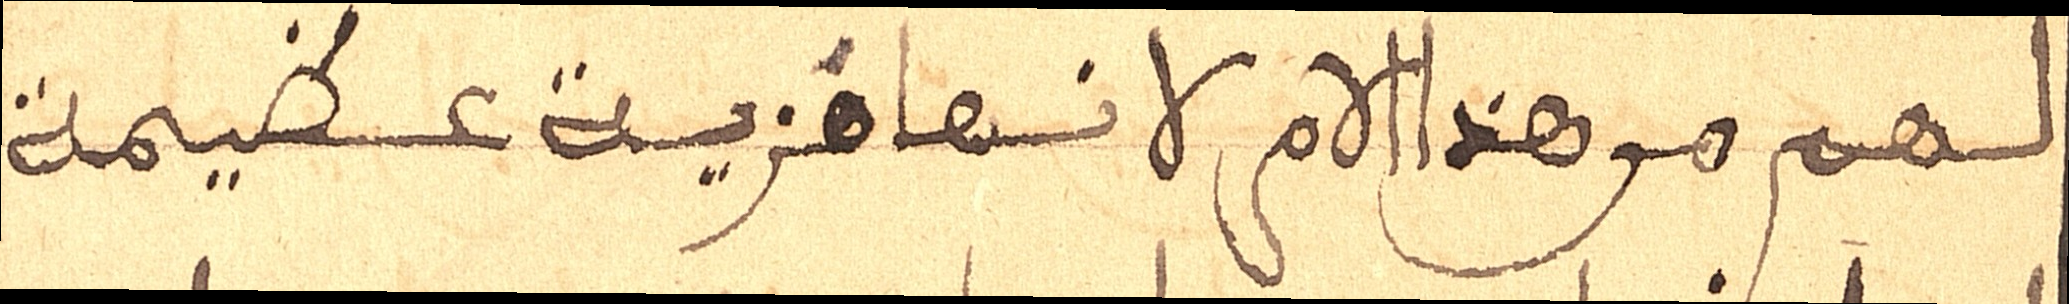لهم من هذا الامر لا نهاهزية عظيمة
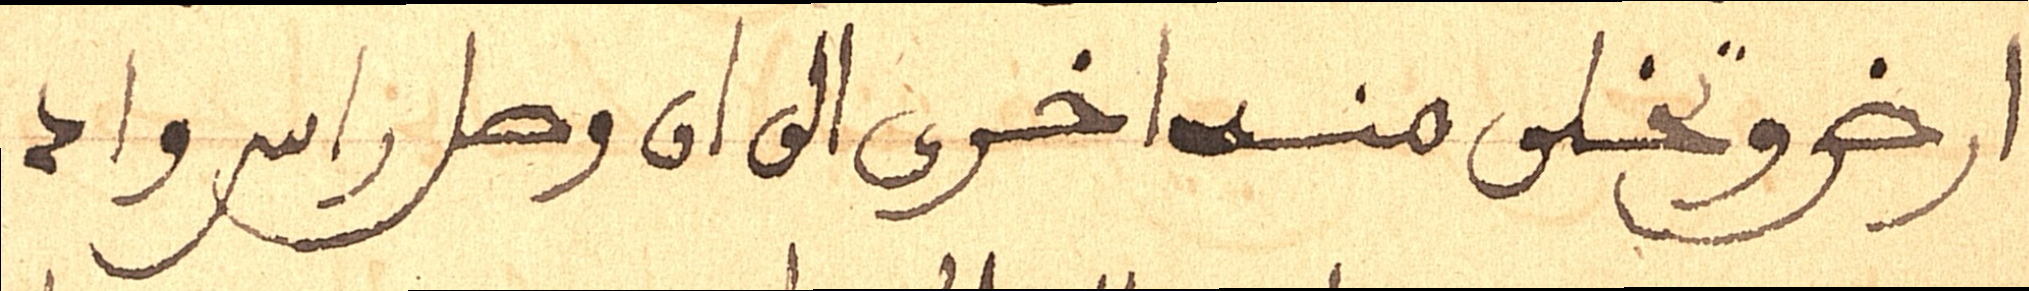ارض وتخلن منه اخرى الى ان وصل راس واد
